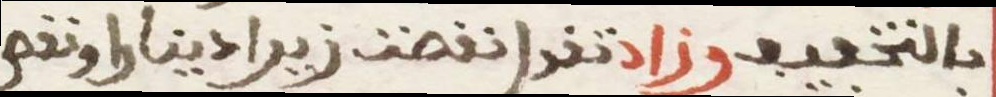بالتخفيف وزاد تقول نقصت زيدا دينارا ونقص
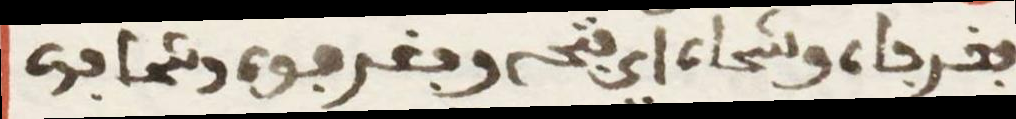فغر فاه وشحاه اي فتحه وفغر فوه وشحا فوه
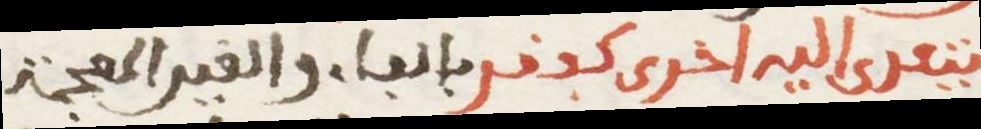يتعدى اليه اخرى كفغر بالفاء والغين المعجمة
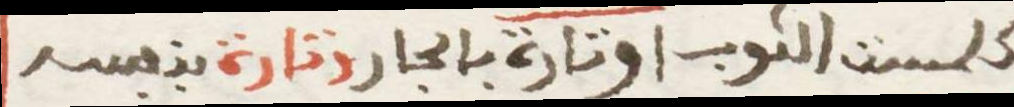كلمست الثوب او تارة بالجار وتارة بنفسه
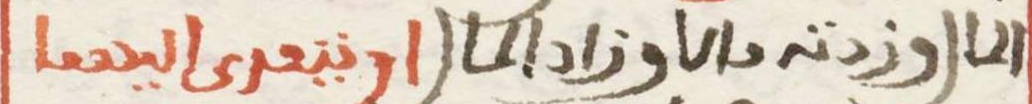المال وزدته مالا وزاد المال او يتعدى اليهما
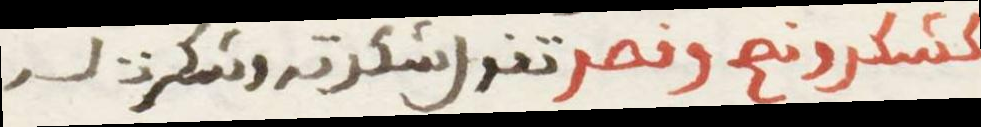كشكر ونصح ونصر تقول شكرته وشكرت له
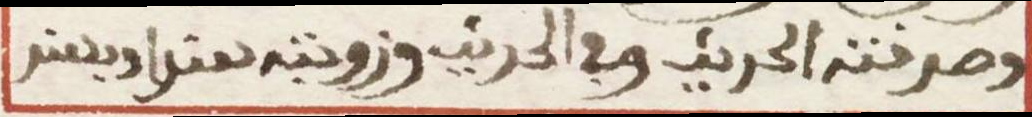وصدقته الحديث وفي الحديث وزوجته هندا وبهند
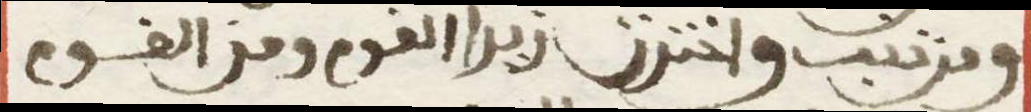ومن ذنب واخترت زيدا القوم ومن القوم
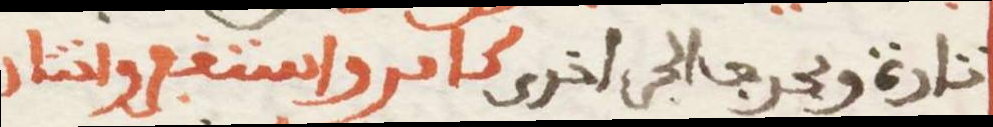تارة وبحرف الجر اخرى كامر واستغفر واختار
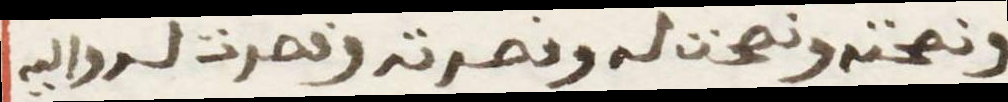ونصحته ونصت له ونصرته ونصرت له واليه
